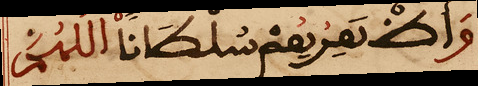و أظهرهم سلطانا اللهم
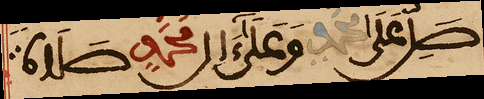صل على محمد و على ءال محمد صلاة
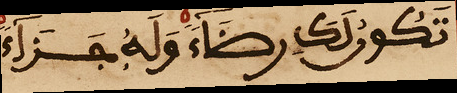تكون لك رضاء و له جزاء
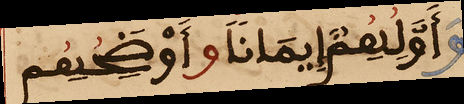و أولهم إيمانا و أوضحهم
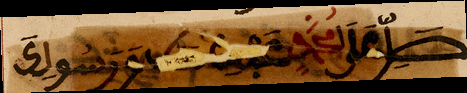صل على محمد و رسولك
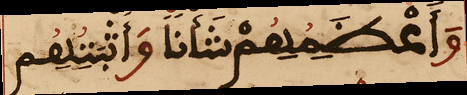و أعظمهم شأنا و أثبتهم
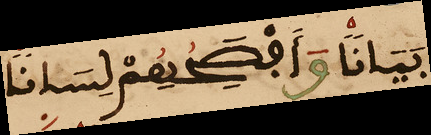بيانا و أفصحهم لسانا
